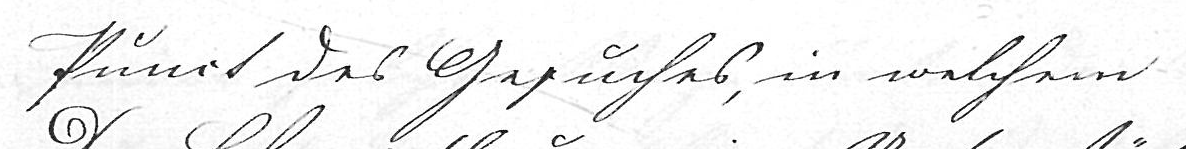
Punct des Gesuches, in welchem
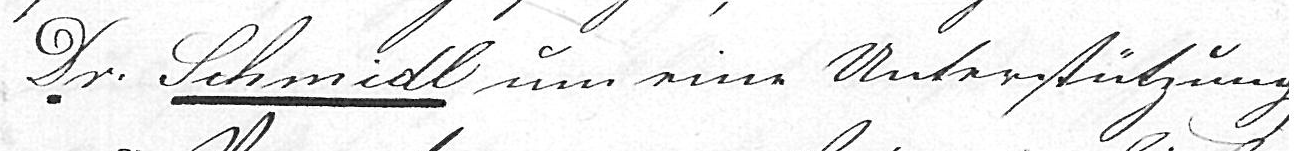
Dr. Schmidl um eine Unterstützung
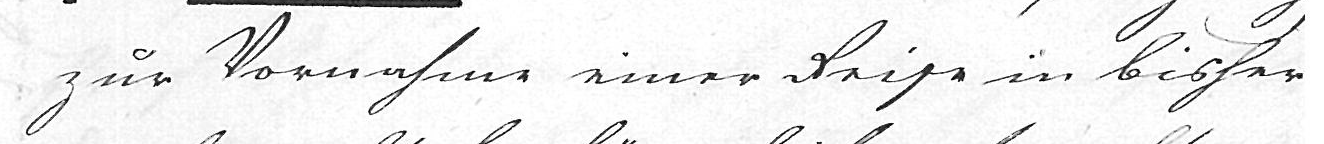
zur Vornahme einer Reise in bisher
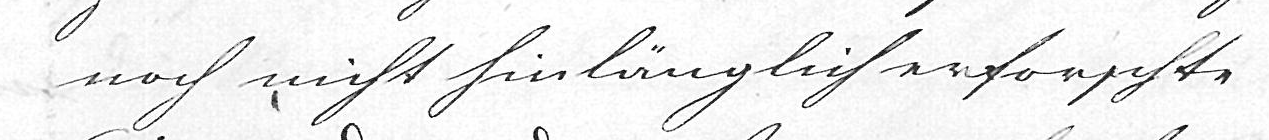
noch nicht hinlänglich erforschte
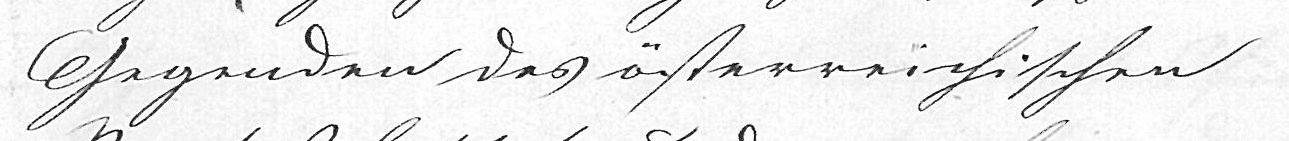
Gegenden des österreichischen
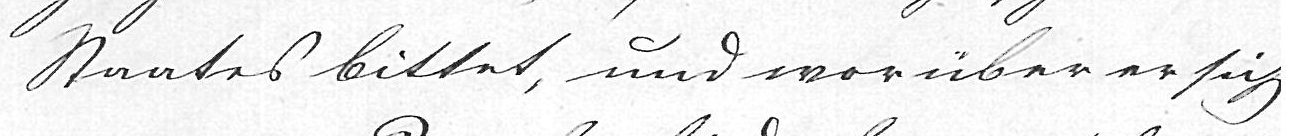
Staates bittet, und worüber er sich
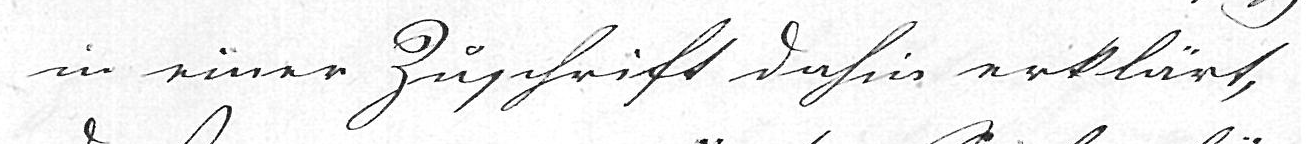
in einer Zuschrift dahin erklärt,
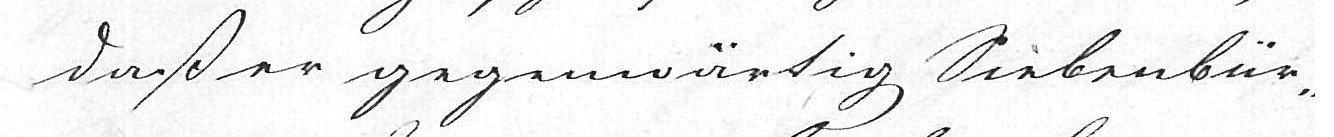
daß er gegenwärtig Siebenbür-
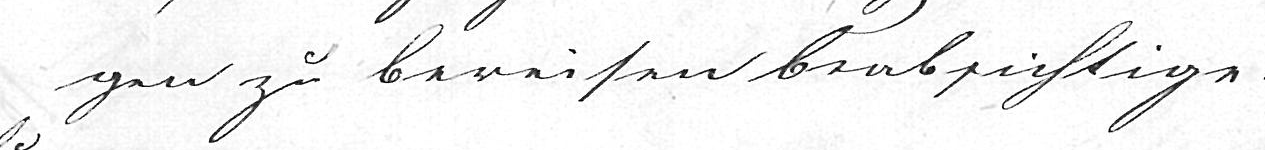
gen zu bereisen beabsichtige.
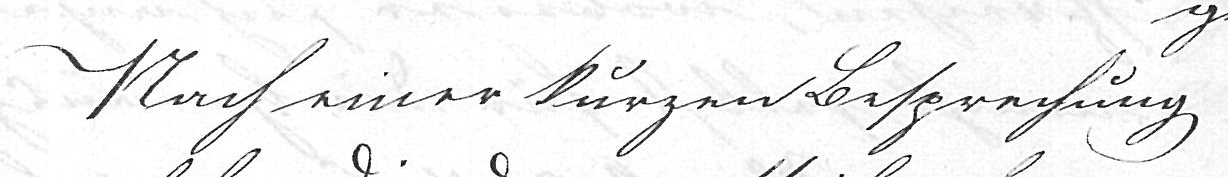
Nach einer kurzen Besprechung
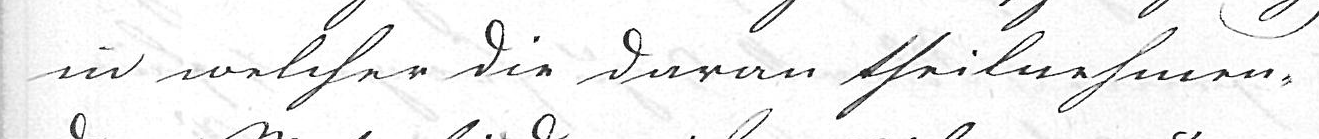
in welcher die daran theilnehmen-
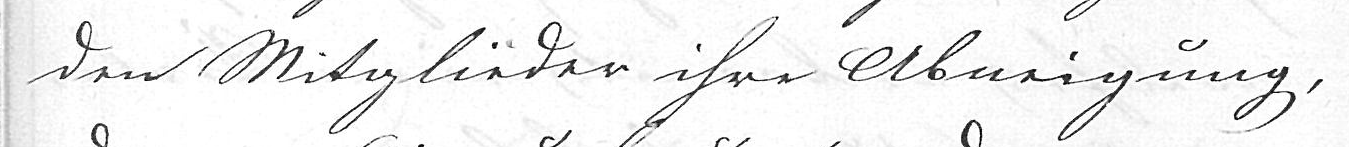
den Mitglieder ihre Abneigung,
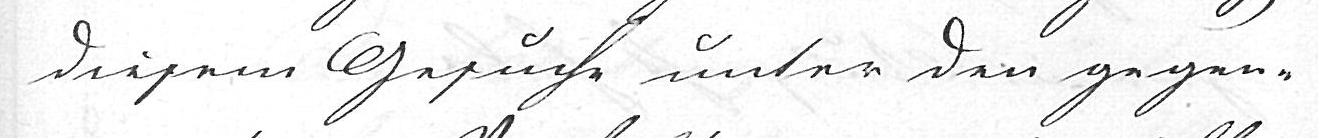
diesem Gesuche unter den gegen-
